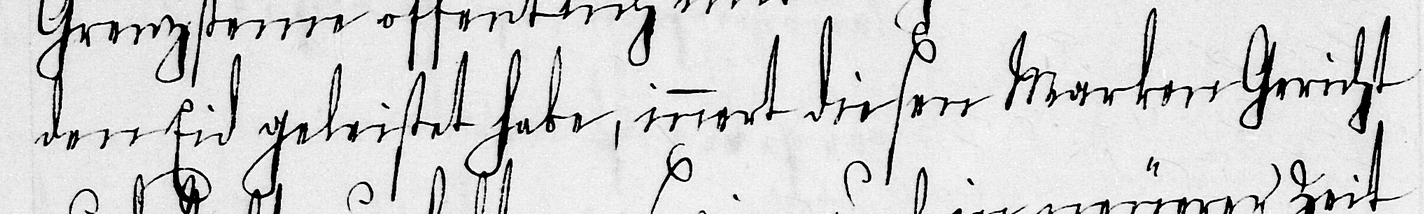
den Eid geleistet habe, inner diesen Marken Gericht
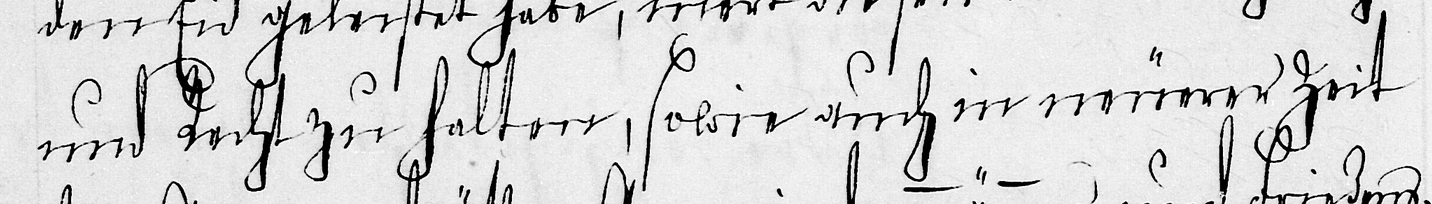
und Recht zu halten, sowie auch in neuerer Zeit
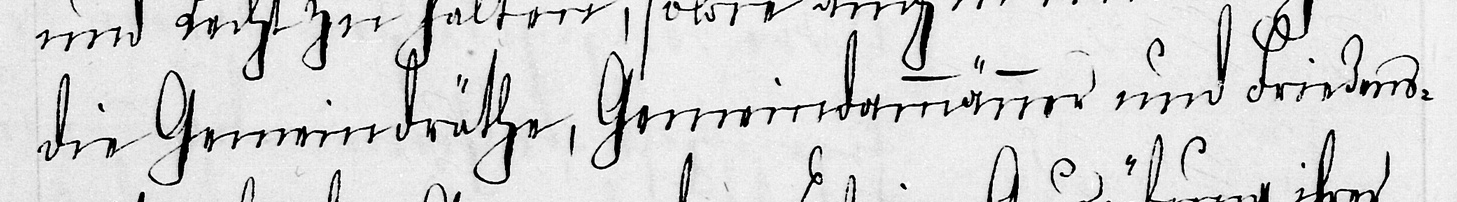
die Gemeindräthe, Gemeindammänner und Friedens¬
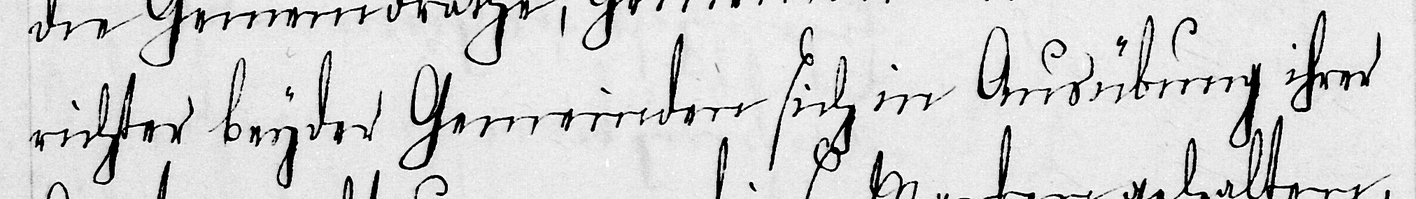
richter beyder Gemeinden sich in Ausübung ihrer
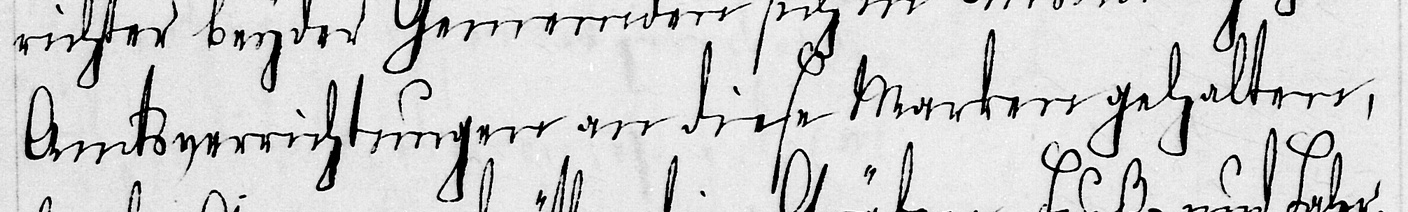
Amtsverrichtungen an diese Marken gehalten,
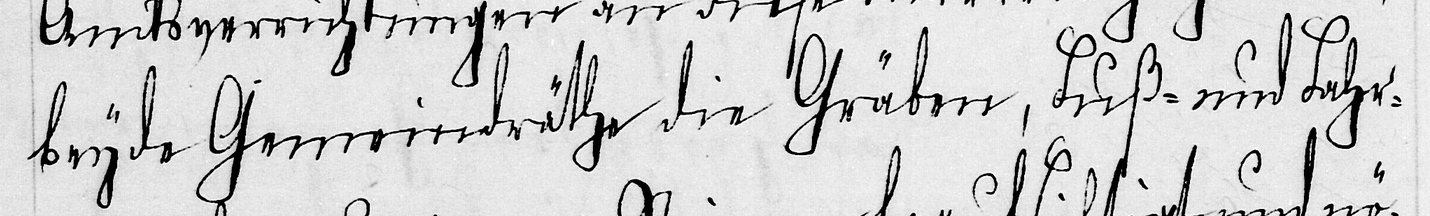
beyde Gemeindräthe die Gräben, Fuß- und Fahr¬
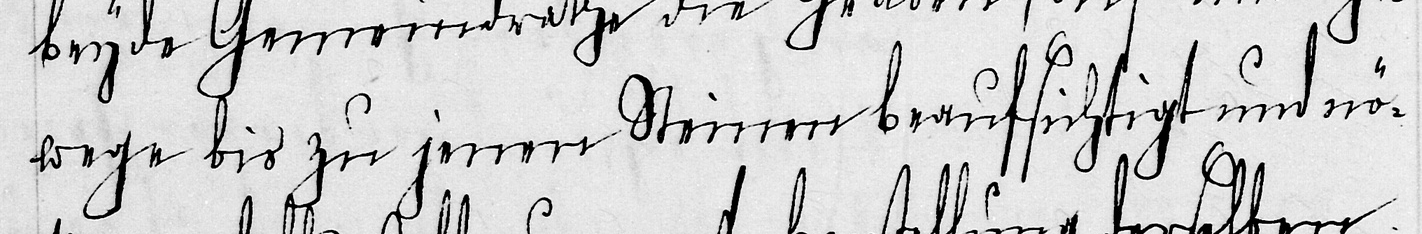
wege bis zu jenen Steinen beaufsichtigt und nö¬
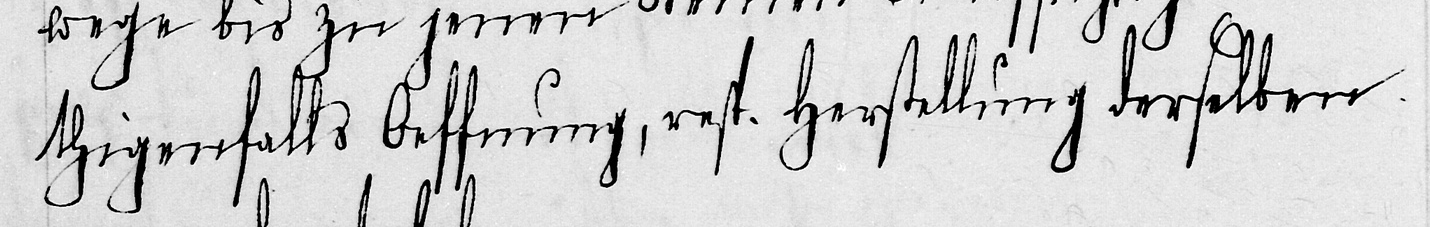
thigenfalls Oeffnung, resp. Herstellung derselben
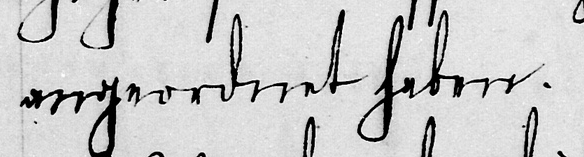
angeordnet haben.
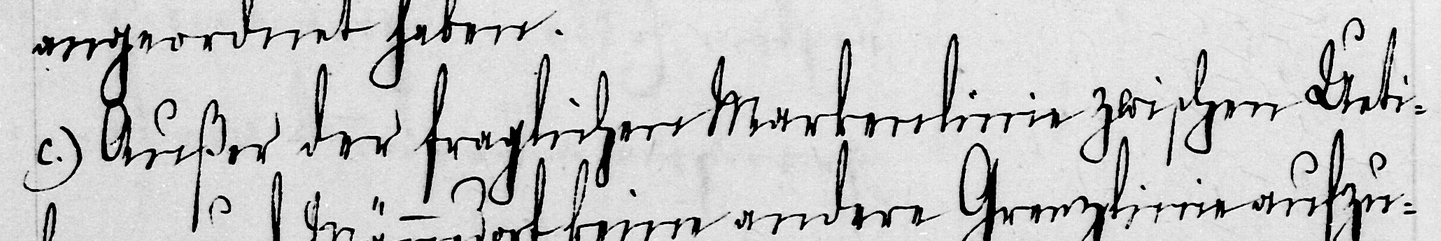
c.) Außer der fraglichen Markenlinie zwischen Ueti¬
